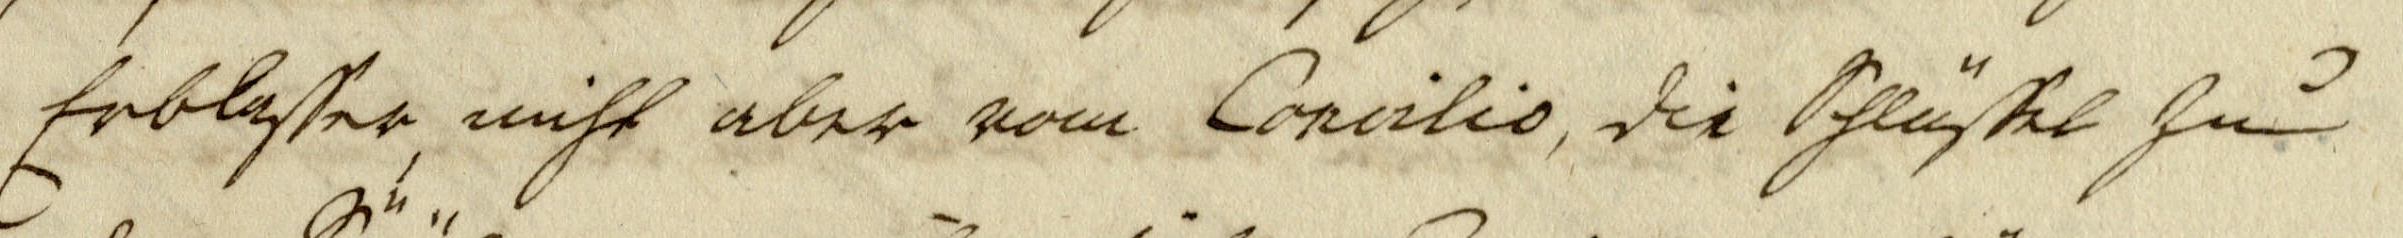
Erblasser nicht aber vom Concilio, die Schlüssel zu
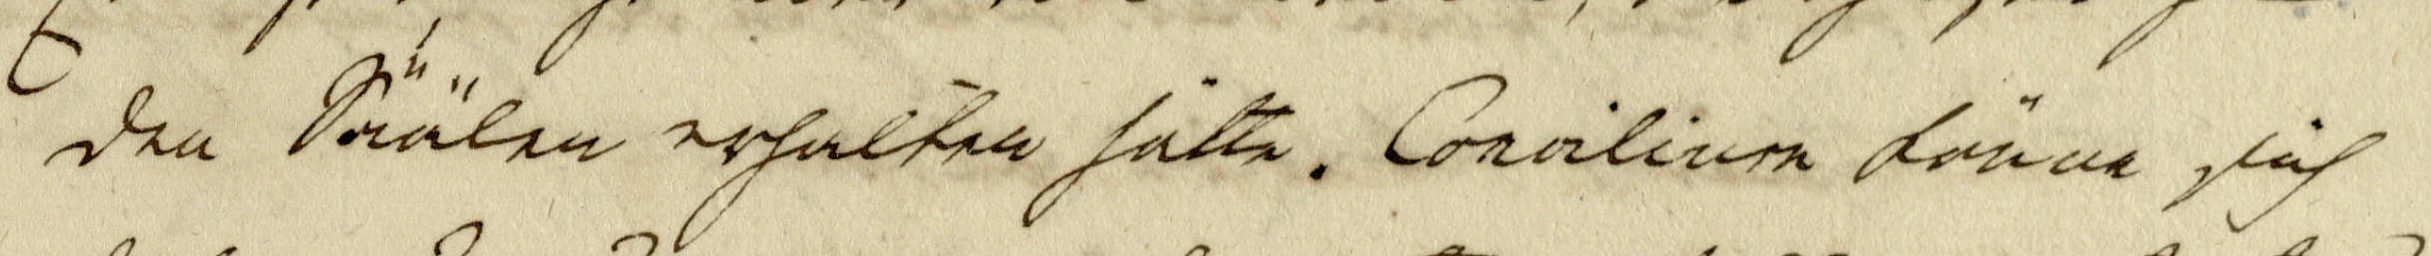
den Säälen erhalten hätte. Concilium könne sich
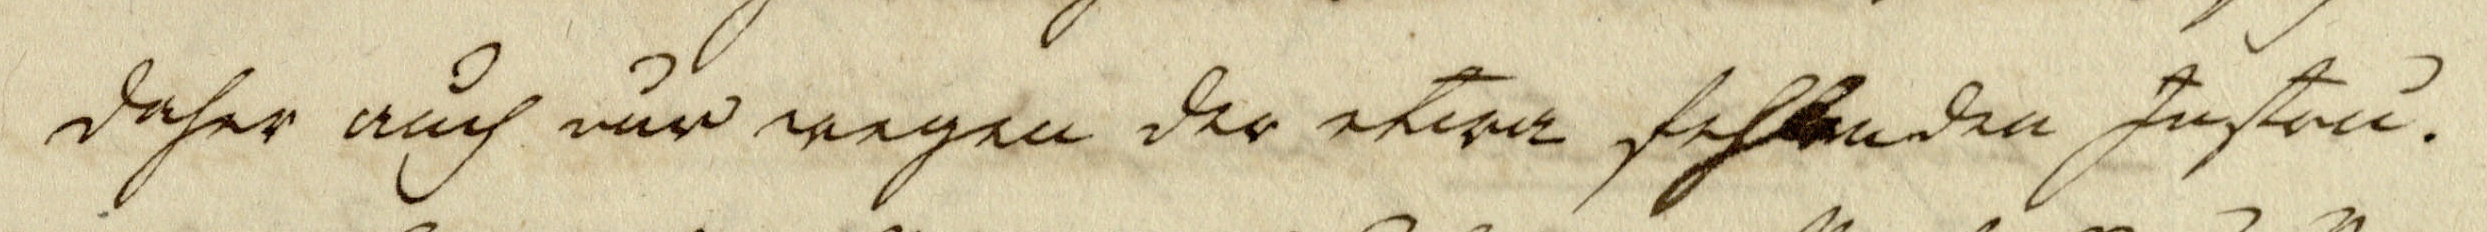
daher auch nur wegen der etwa fehlenden Instru¬
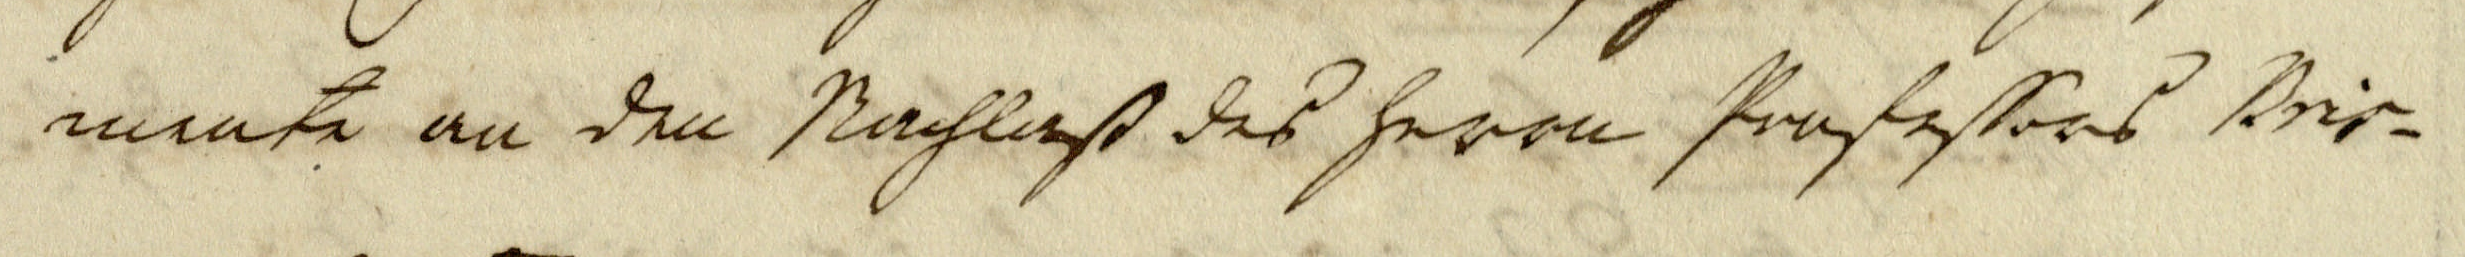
mente an den Nachlaß des Herrn Professors Bris¬
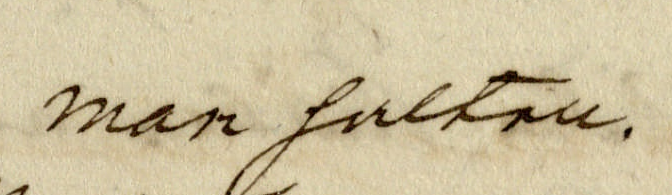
man halten.
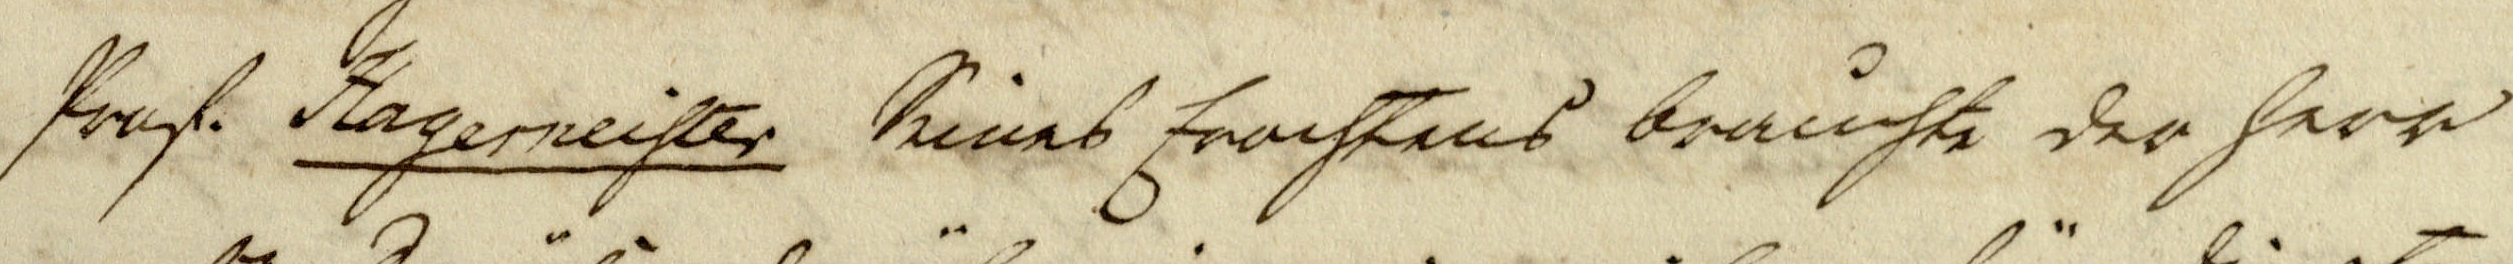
Prof. Hagemeister Seines Erachtens brauchte der Herr
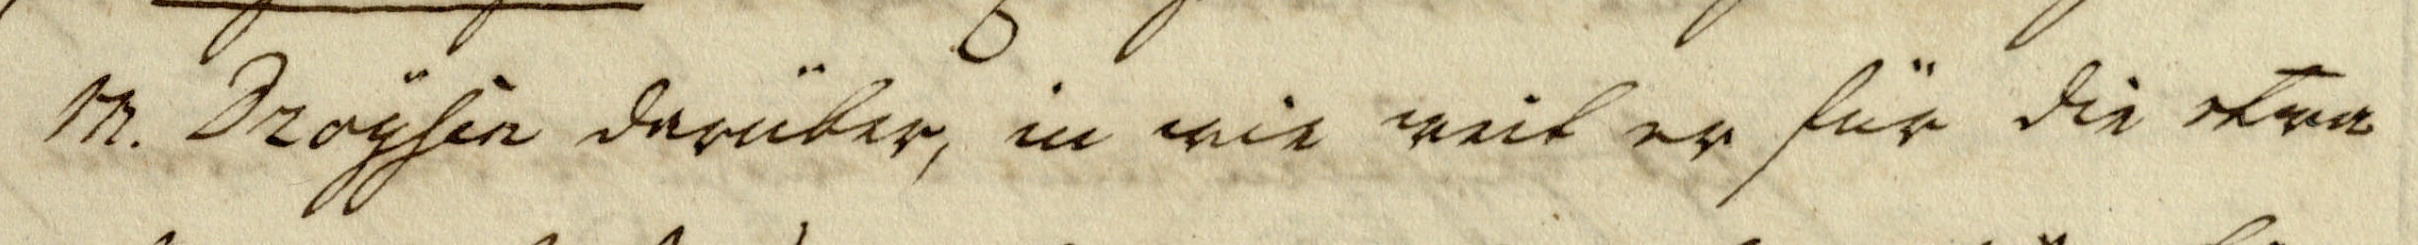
M. Droÿsen darüber, in wie weit er für die etwa
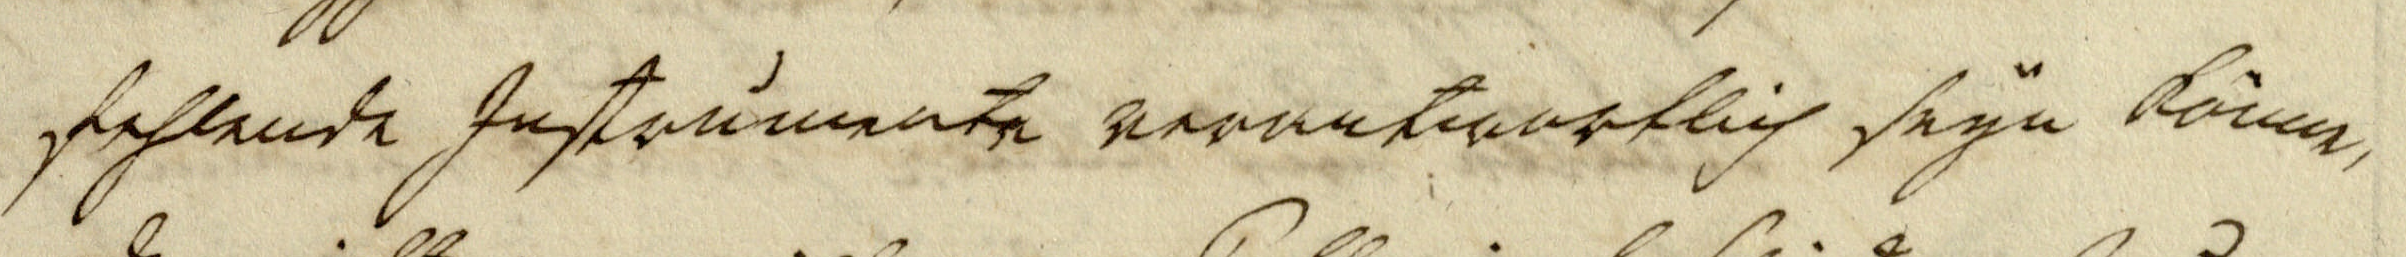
fehlende Instrumente vernntwürtlich seÿn könne,
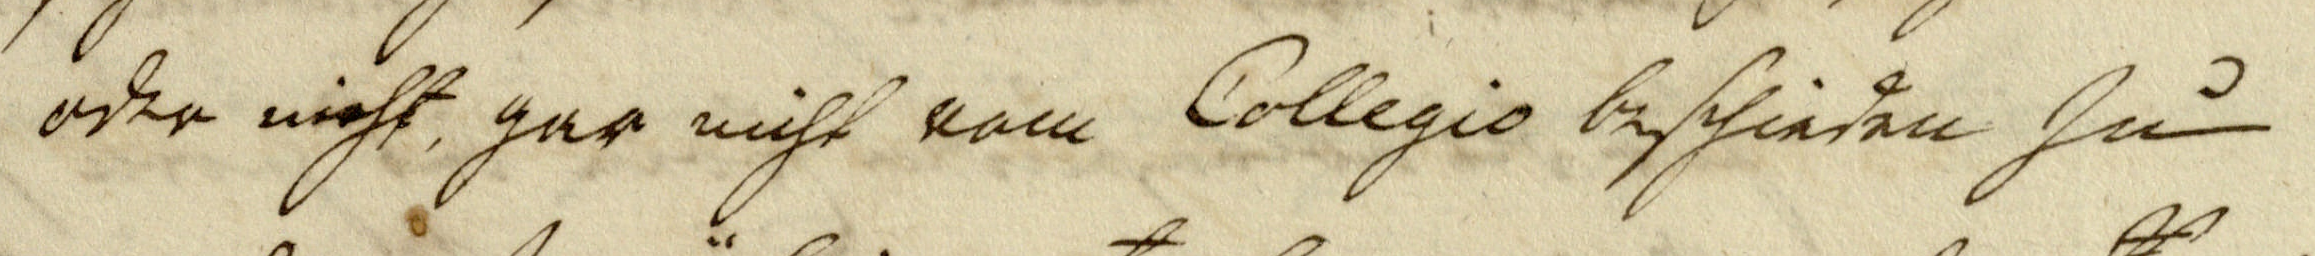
oder nicht, gar nicht vom Collegio beschieden zu
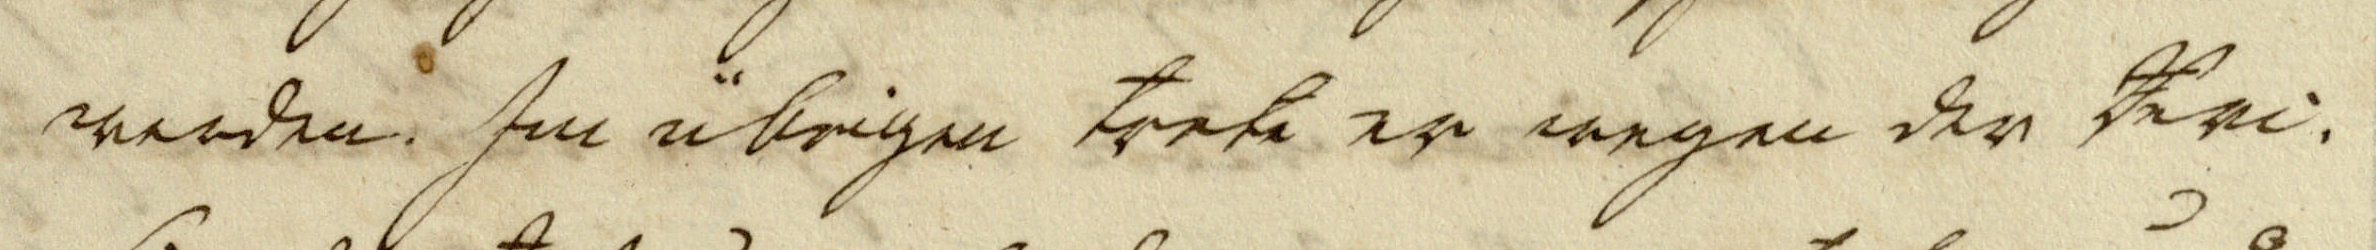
werden. Im übrigen trete er wegen der Revi¬
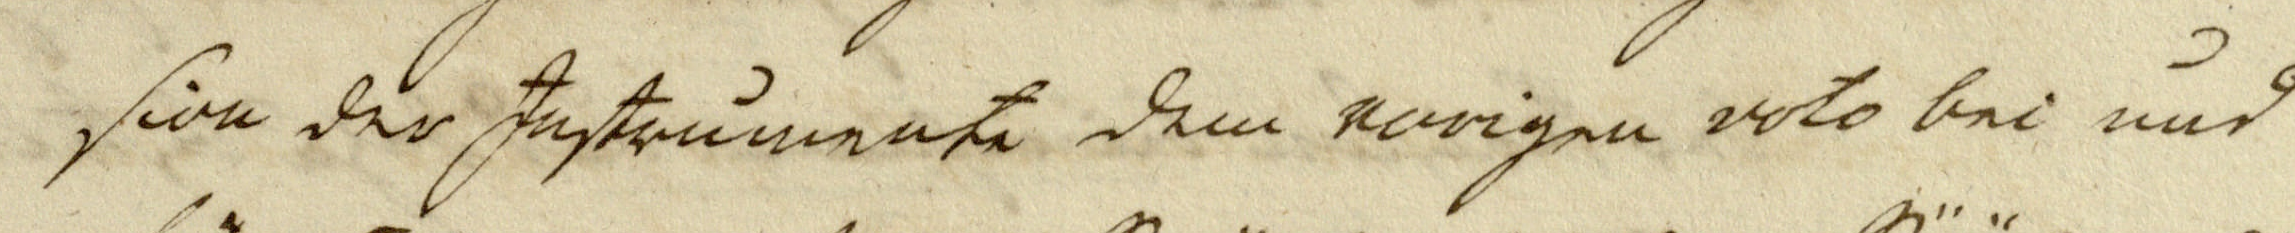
sion der Instrumente dem vorigen voto bei und
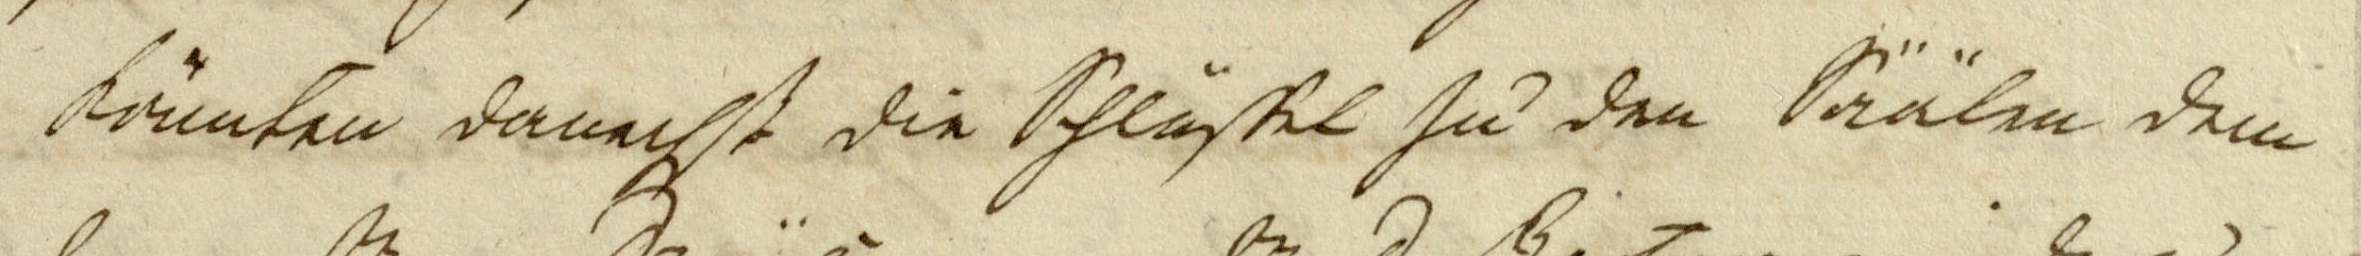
könnten danechst die Schlüssel zu den Säälen dem
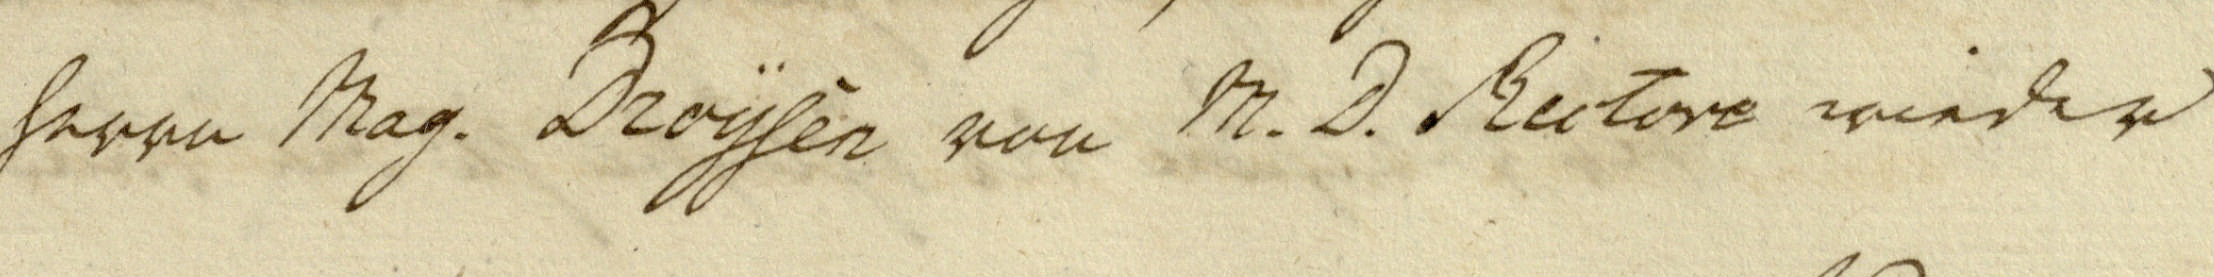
Herrn Mag. Droÿsen von M. D. Rectore wieder
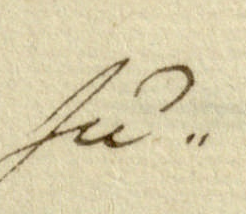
zu¬
